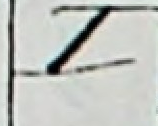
I
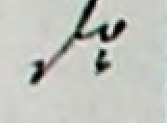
do
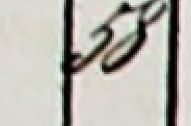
58
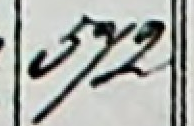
572
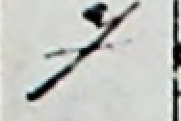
7
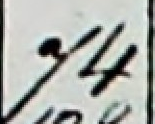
74
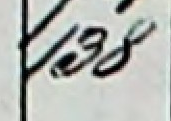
138
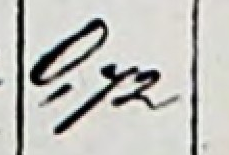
0,72
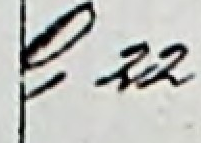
0,22
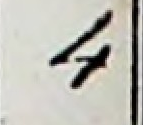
4
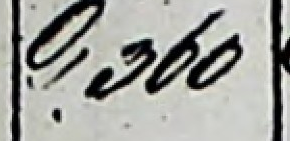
0,360
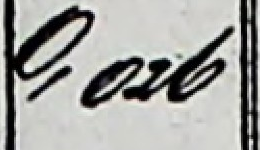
0,026
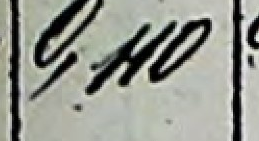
0.110
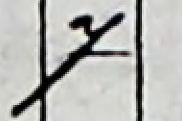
7
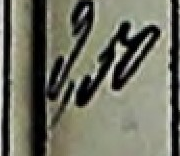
3,50
